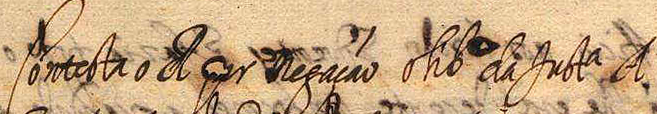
Contesta o R por negação o libo da Justa A.
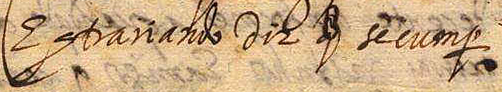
E ꝯtrariando diz q̄ se cumꝑ
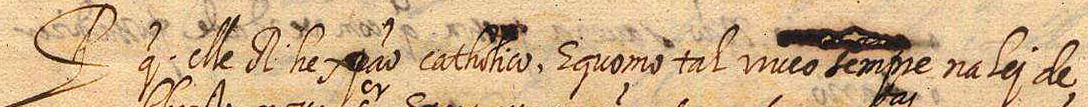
P q̄. elle R. he xpão catholico, E quomo tal viueo sempre na lej de
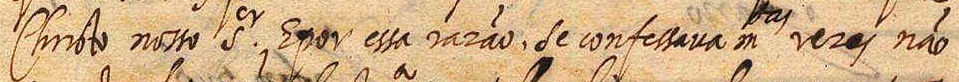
Christo nosso sor. E por essa razão se confessaua mtas vezes não
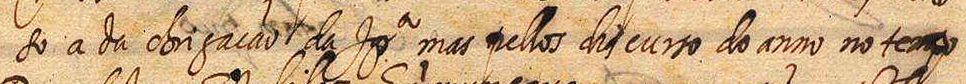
so a da obrigacão da Jgr.a mas pellos discurso do anno no tempo
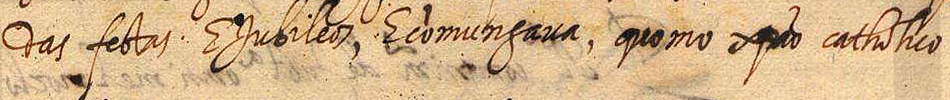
das festas. E Jubileos, E comungaua, quomo xpão catholico
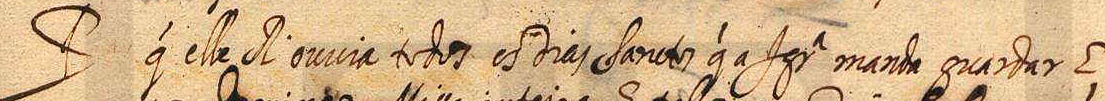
P q̄ elle R. ouuia todos os dias Sanctos q̄ a Jgra manda guardar E
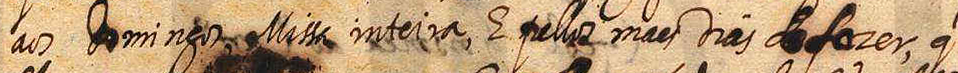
aos domingos Missa inteira, E pellos maes dias do fazer, q̄
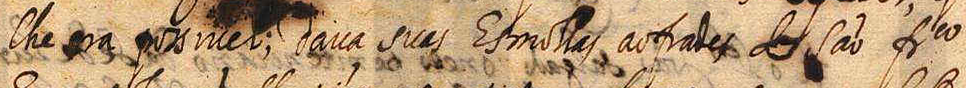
lhe era possiuel; daua suas Esmollas ao frades de saõ frco
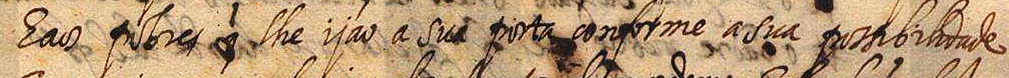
E aos pobres q̄ lhe ijão a sua porta conforme a sua possibilidade
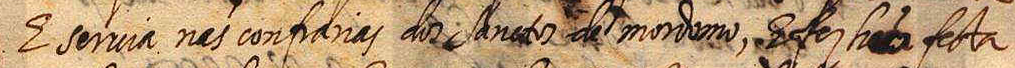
E seruia nas confrarias dos Sanctos de mordomo, E fez hūa festa
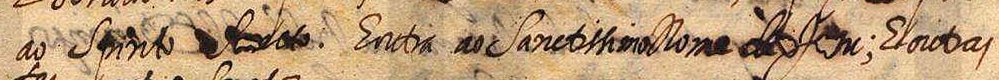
ao Spirito Sancto. E outra ao Sanctissimo Nome de Jesu; E outras
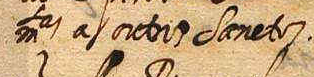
mtas a outros Sanctos.
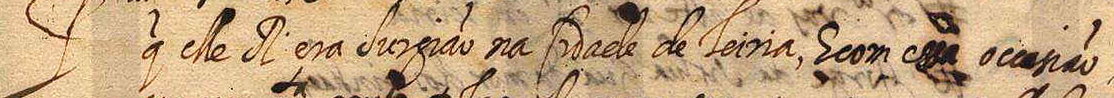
P q̄ elle R. era Surgião na Cidade de Leiria, E com essa occasião,
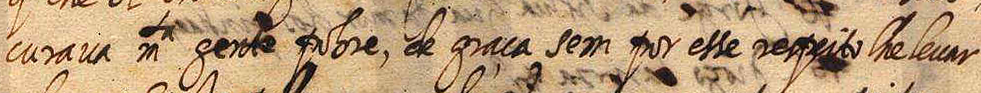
curaua mta gente pobre, de graça sem por esse respeito lhe leuar
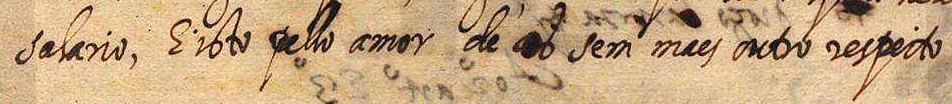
salario, E isto pello amor de _s ao sem maes outro respeito
